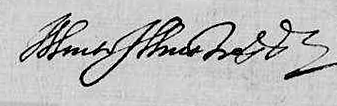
Muito Jllustres s̄res
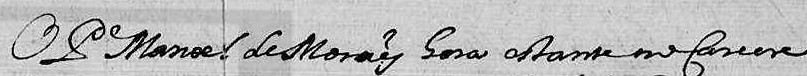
O Pe Manoel de Moraēs hora estante no Carcere
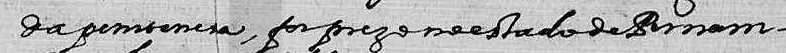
da penitencia, foi prezo no estado de Pernam
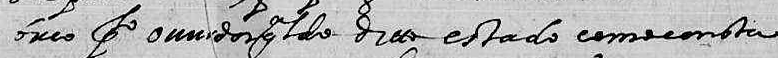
buco plo ouuidor gal do ditto estado como consta
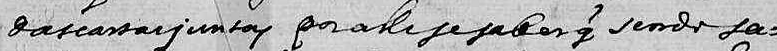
das cartas juntas por elle se saber q̄ sendo sa
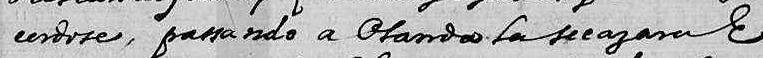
cerdote, passando a Olanda la se cazara E
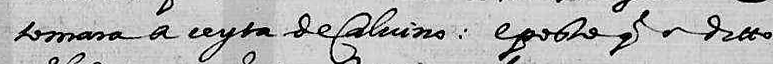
tomara a ceyta de Caluino: e posto q̄ o ditto
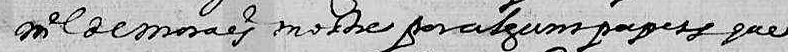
mel de moraēs mostre por alguns papeis que
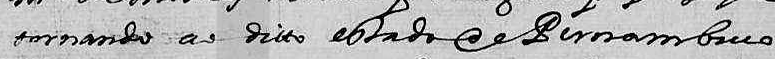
tornando ao ditto estado de Pernambuco
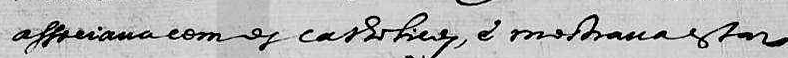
associaua com os catholicos, e mostraua estar
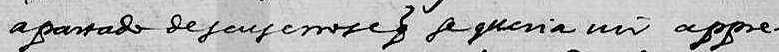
apartado de seus erros e q̄ se queria uir appre
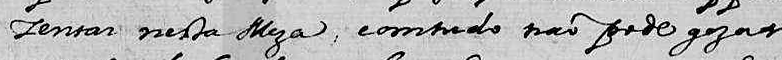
zentar nesta Meza, comtudo naõ pode gozar
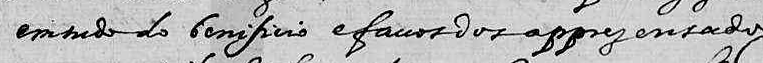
em tudo do benificio e fauor dos apprezentados
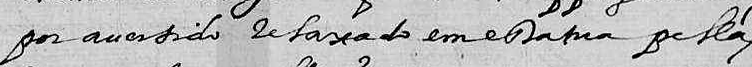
por auer sido relaxado em estatua pellas
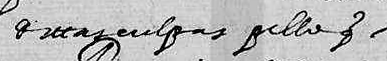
dittas culpas pello q̄
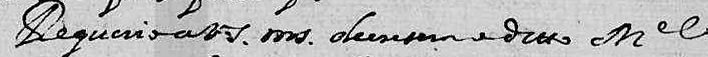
Requeiro a vs. ms. decretem o ditto Mel
